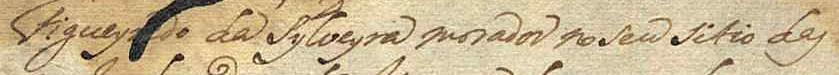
Figueyredo da Sylveyra morador no seu sitio das
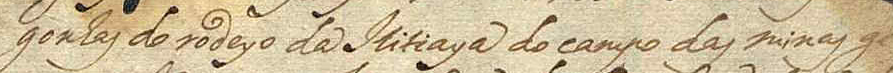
gonhas do rodeyo da Ititiaya do campo das minas ge
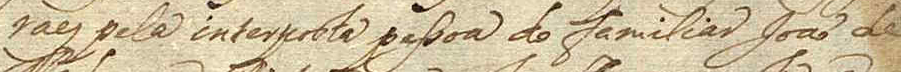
raes pela interposta pessoa do familiar João de
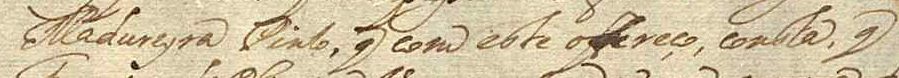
Madureyra Pinto, q̄ com este offereço, consta, q̄
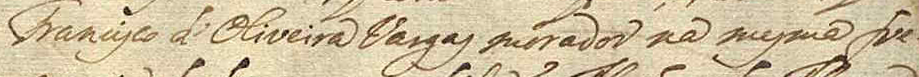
Francisco d'Oliveira Vargas morador na mesma fre
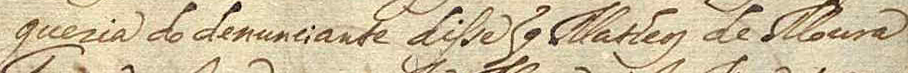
guezia do denunciante disse q̄ Matheos de Moura
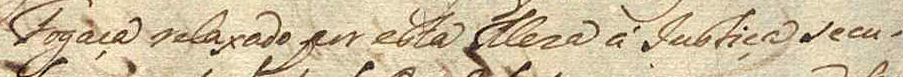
Fogaça relaxado por esta Meza á Iustiça secu
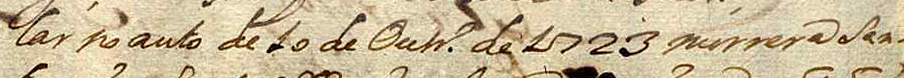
lar no auto de 10 de Outr.o de 1723 morrera San
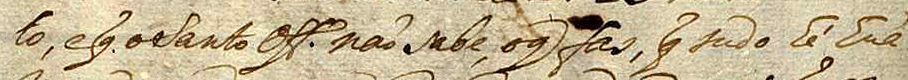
to, e q̄ o Santo Off.o naõ sabe, o q̄ fas, q̄ tudo hé huā
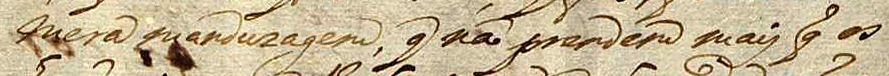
mera manduzagem, q̄ naõ prendem mais q̄ os
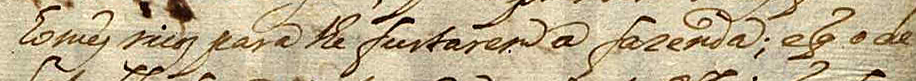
homēs ricos para lhe furtarem a fazenda; e q̄ o de
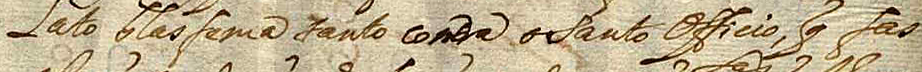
Lato blasfema tanto contra o Santo Officio, q̄ fas
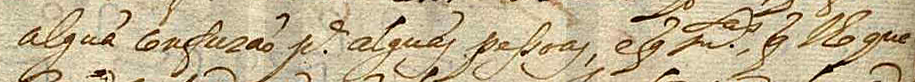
alguā confuzaõ p.a alguās pessoas, e q̄ m.tas, q̄ lho que
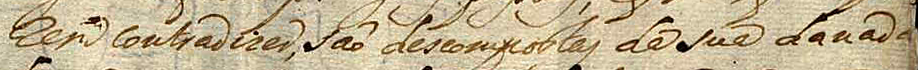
Rem contradizer, saõ descompostas da sua danada
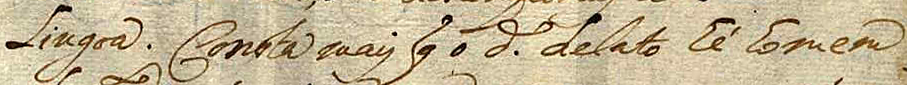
Lingoa. Consta mais q̄ o d.o delato hé homem
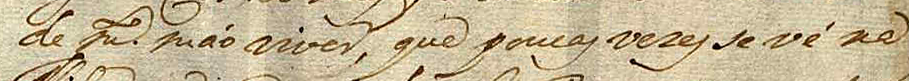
de m.to máo viver, que poucas vezes se vé na
